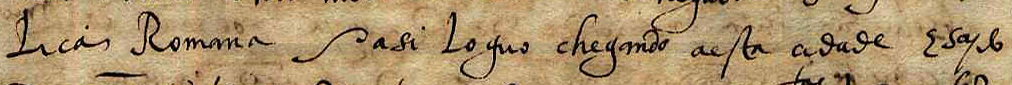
Lica Romana e asi loguo chegando a esta cidade E sajdo
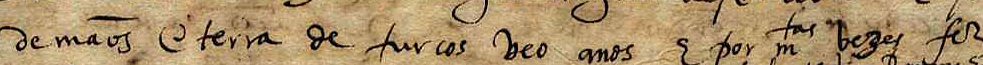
de mãos e terra de turcos veo a nos E por mtas vezes fez
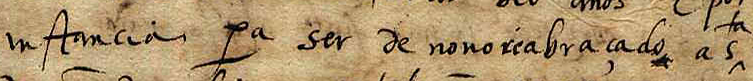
instancia, ꝑa ser de nouo reabraçado a sta
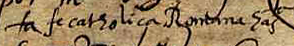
fe catholica Romana E a sta
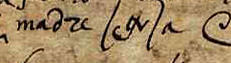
madre Jegrja e
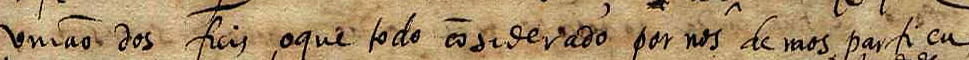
vnião dos fieis o que todo cōsiderado por nos demos particu
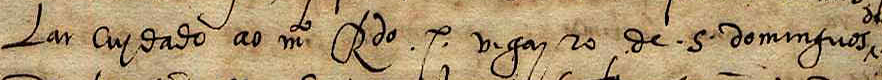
Lar cujdado ao mto Rdo .p. vigajro de .S. dominguos
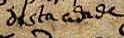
desta cidade
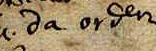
da ordem
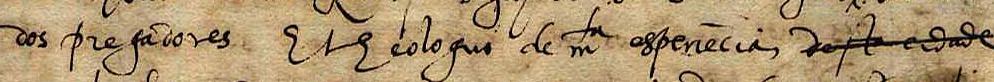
dos pregadores E theologuo de mta esperiēcia, desta cidade
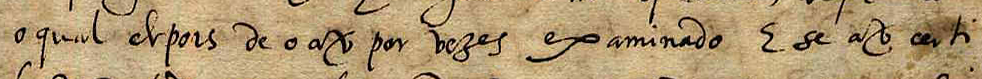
o qual depois de o aꝟ por vezes examinado E se aꝟ certi
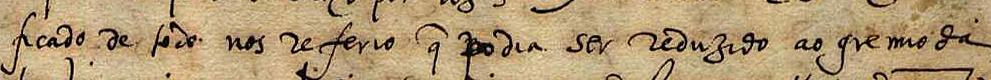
ficado de todo nos referio q̄ podia ser reduzido ao gremio da
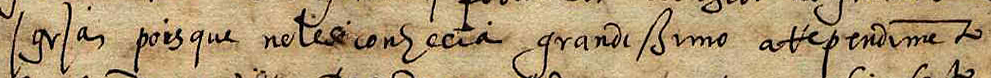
Jgrja, pois que nele se conhecia grandissimo aRependimēto
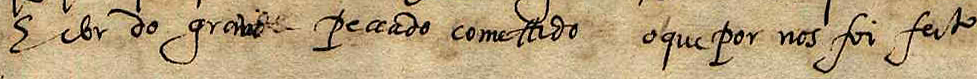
E dor do graue peccado comettido o que por nos foi feito
